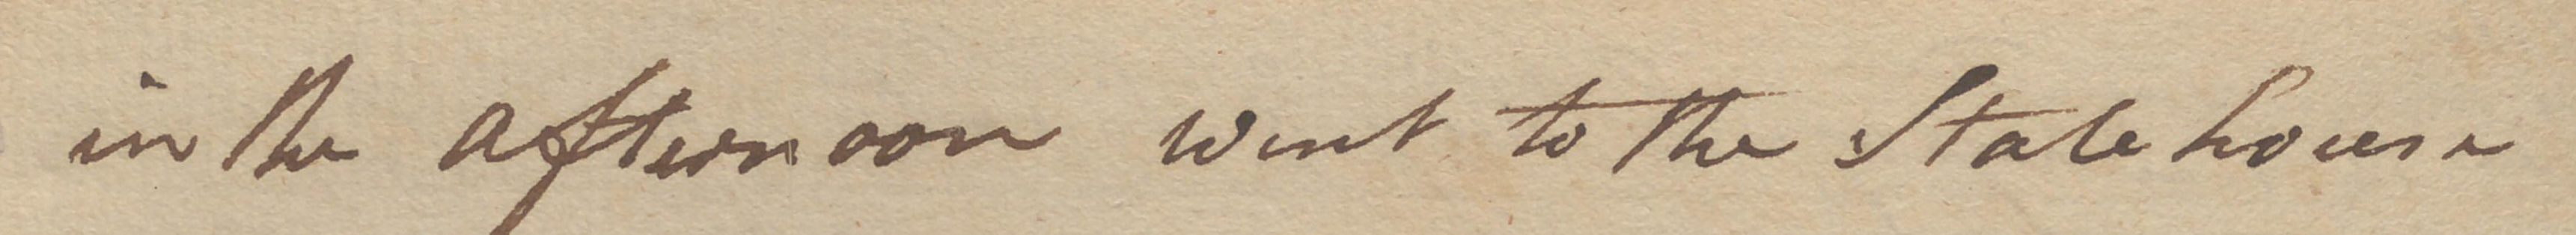in the afternoon went to the State house
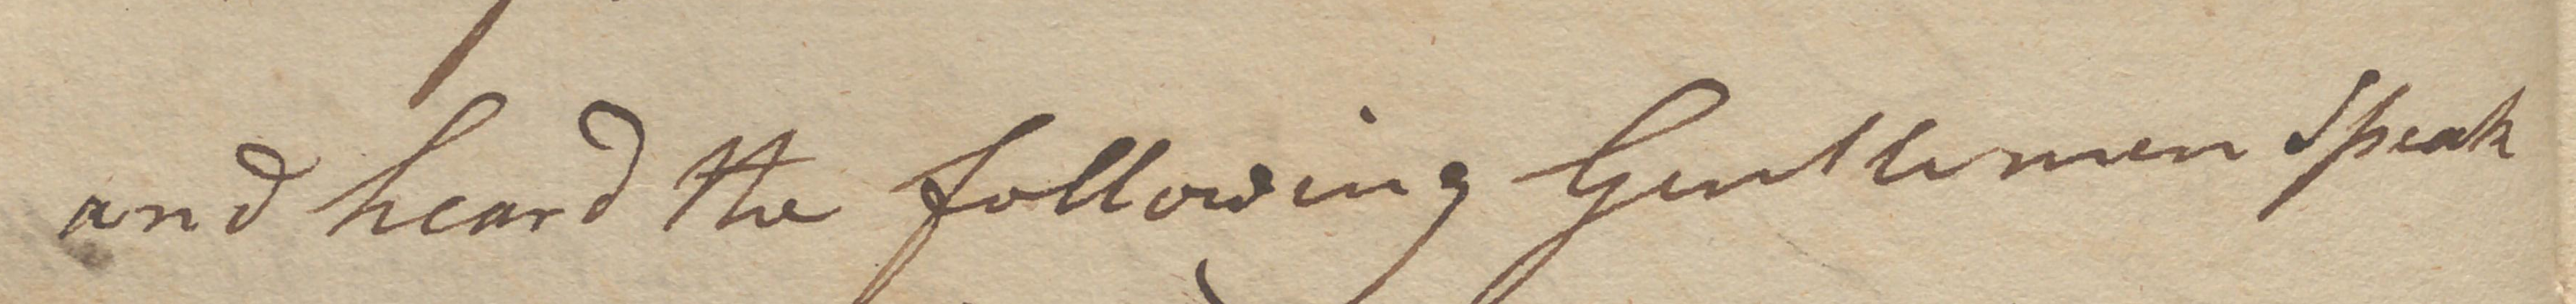and heard the following Gentlemen speak
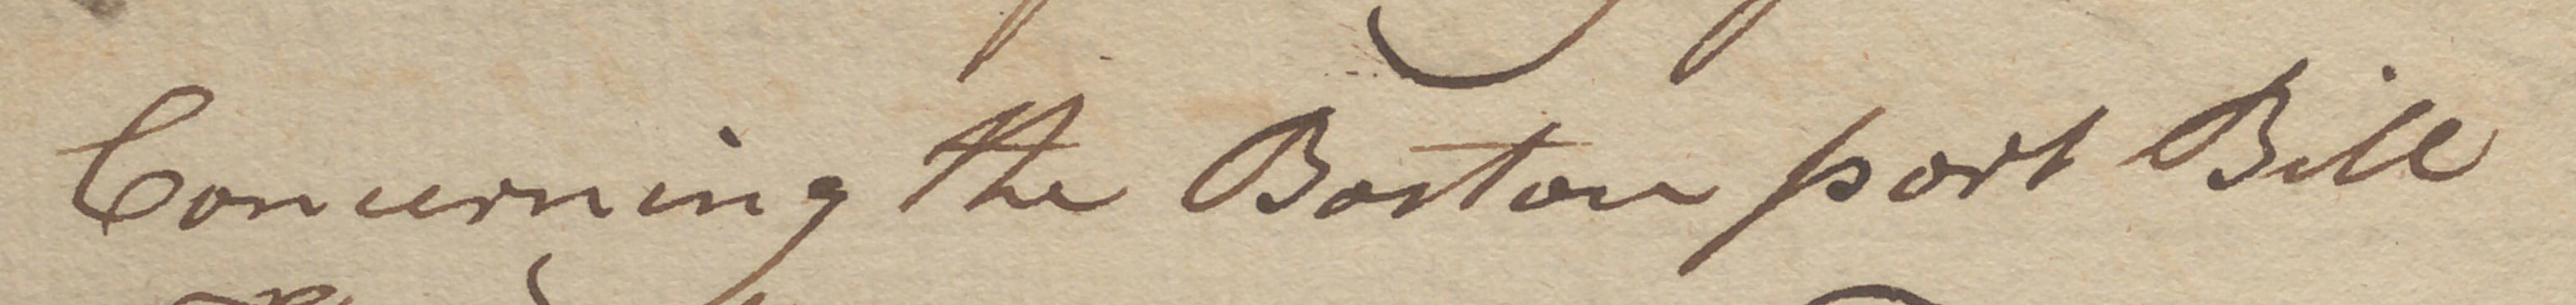Concerning the Boston port Bill
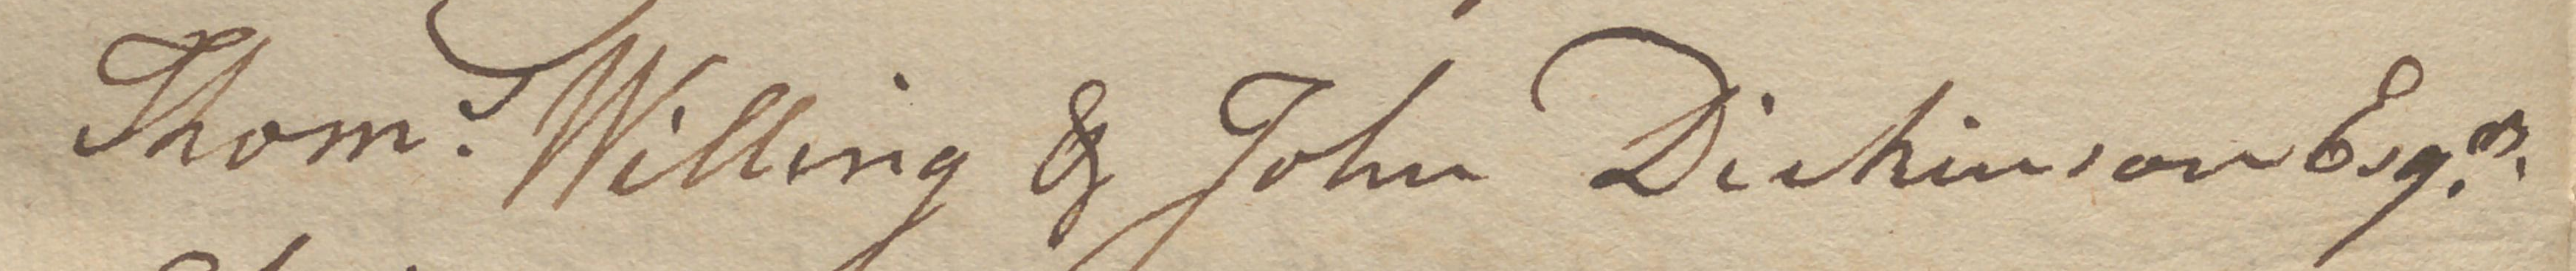Thom^s. Willing & John Dickinson Esq^rs.
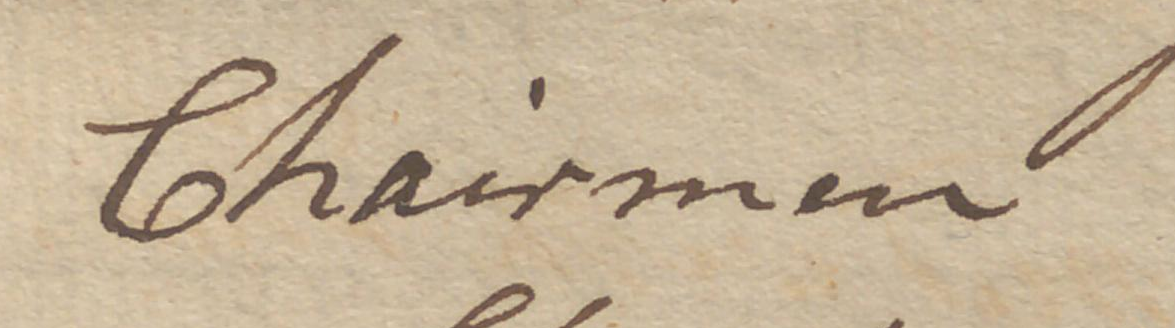Chairmen
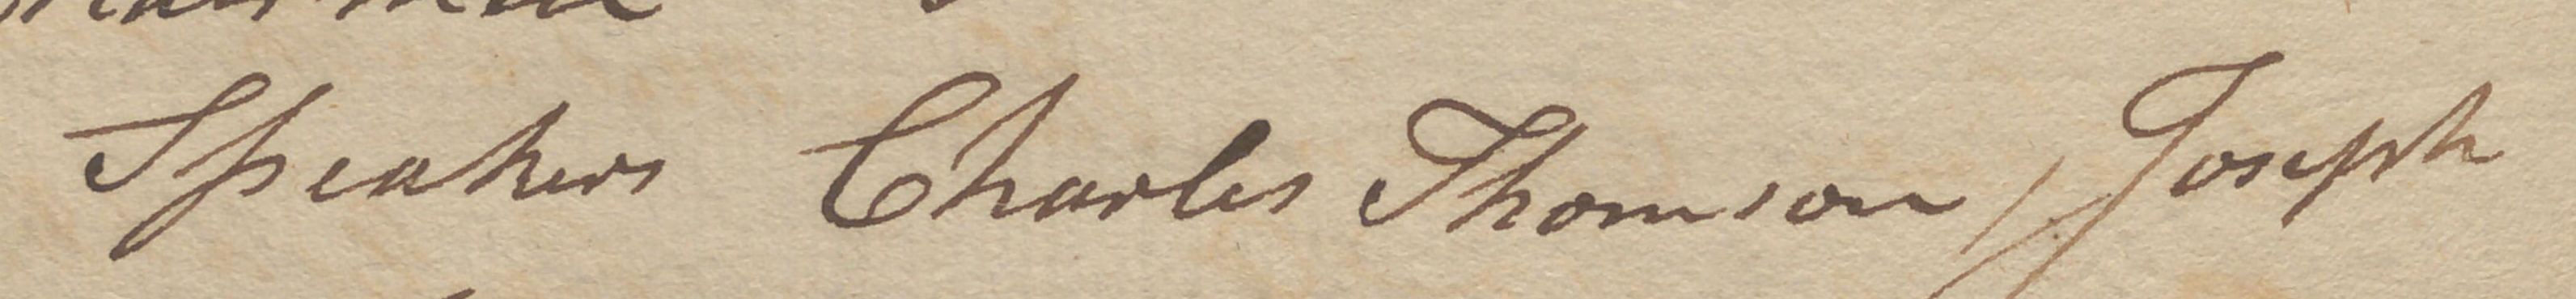Speakers Charles Thomson, Joseph
